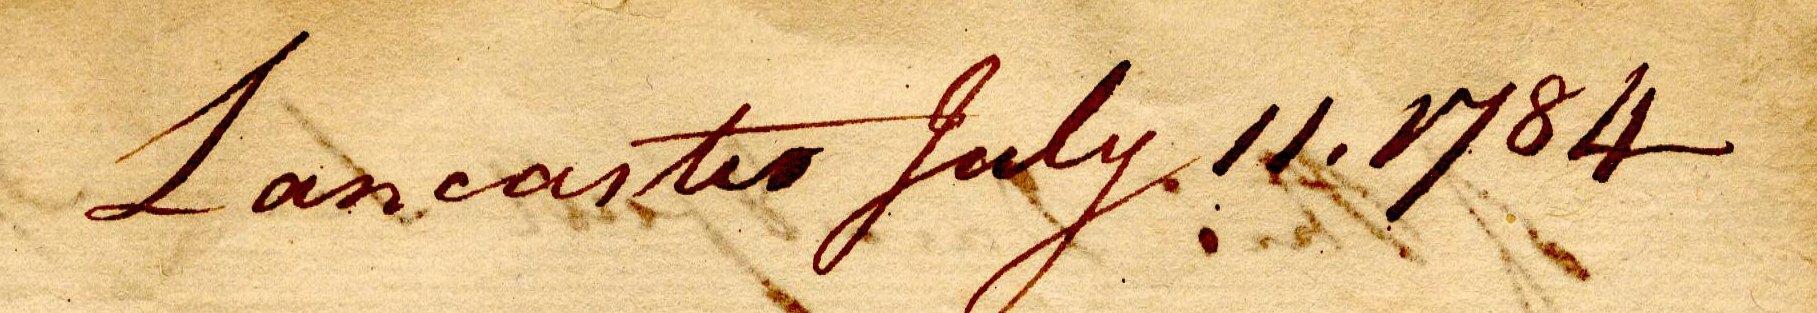Lancaster July 11. 1784
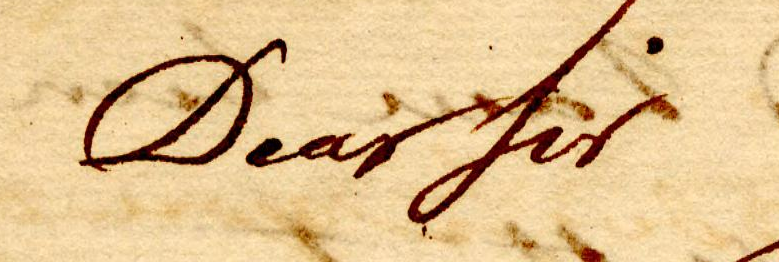Dear Sir
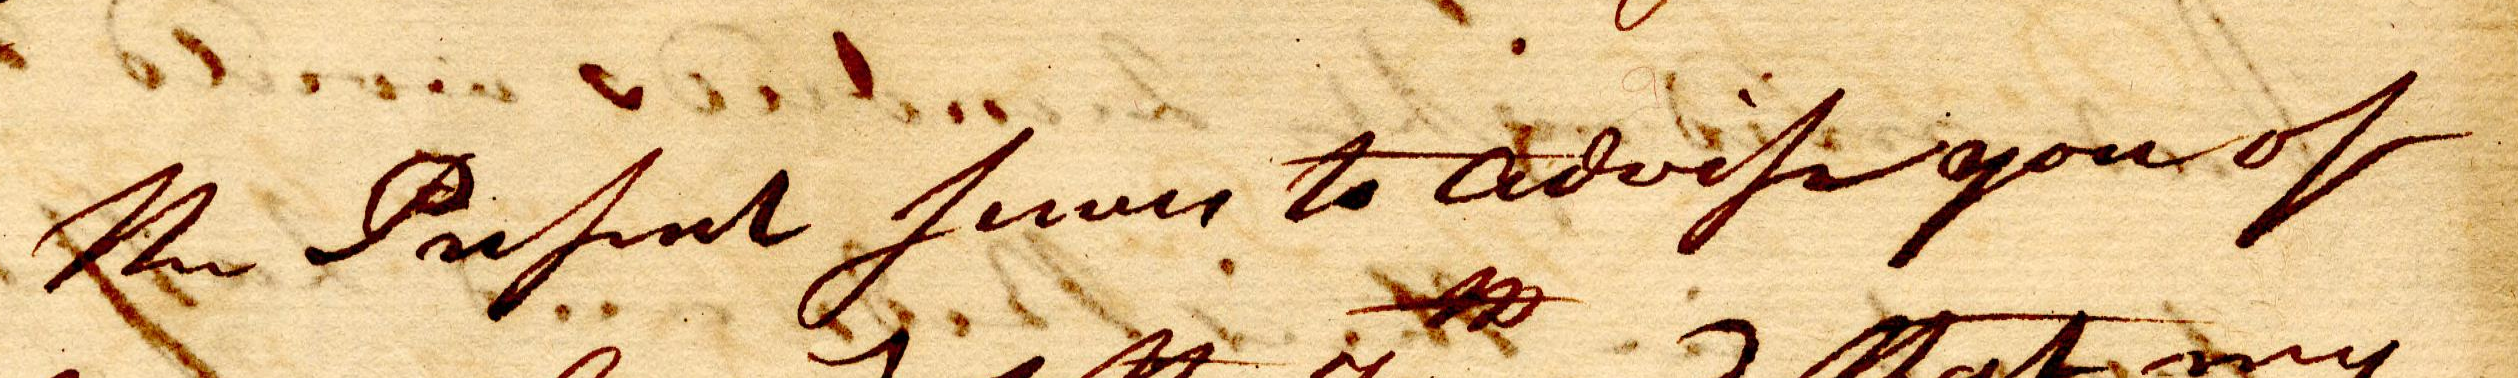The Present serves to Advise you of
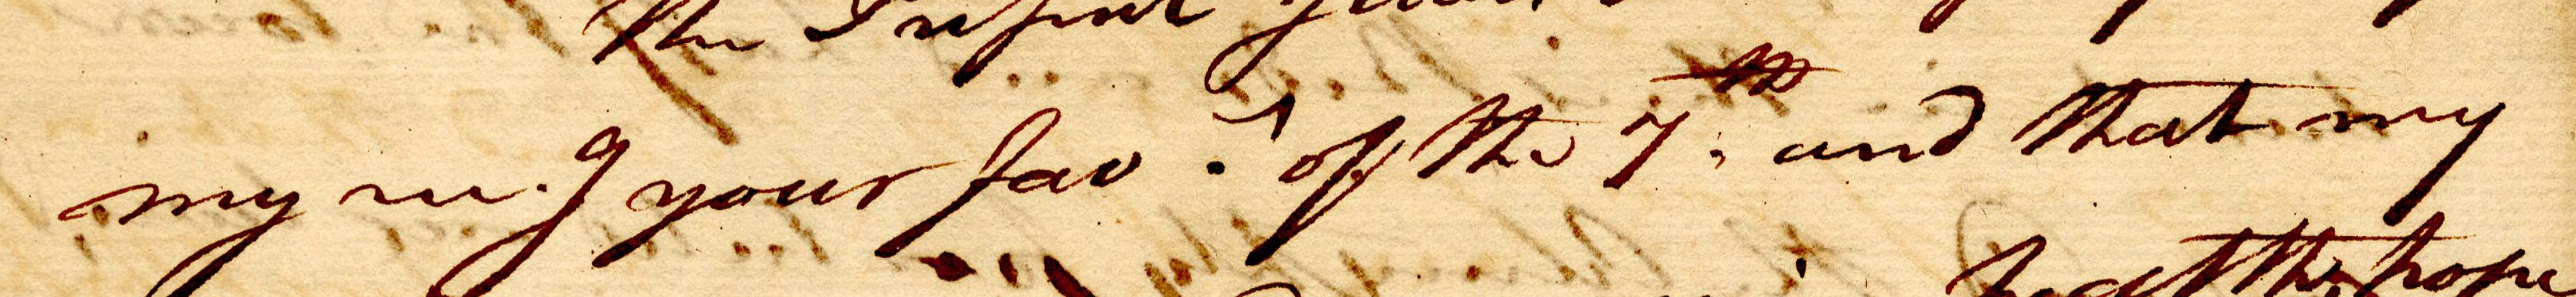my rec^g your fav^r. of the 7^th. and that my
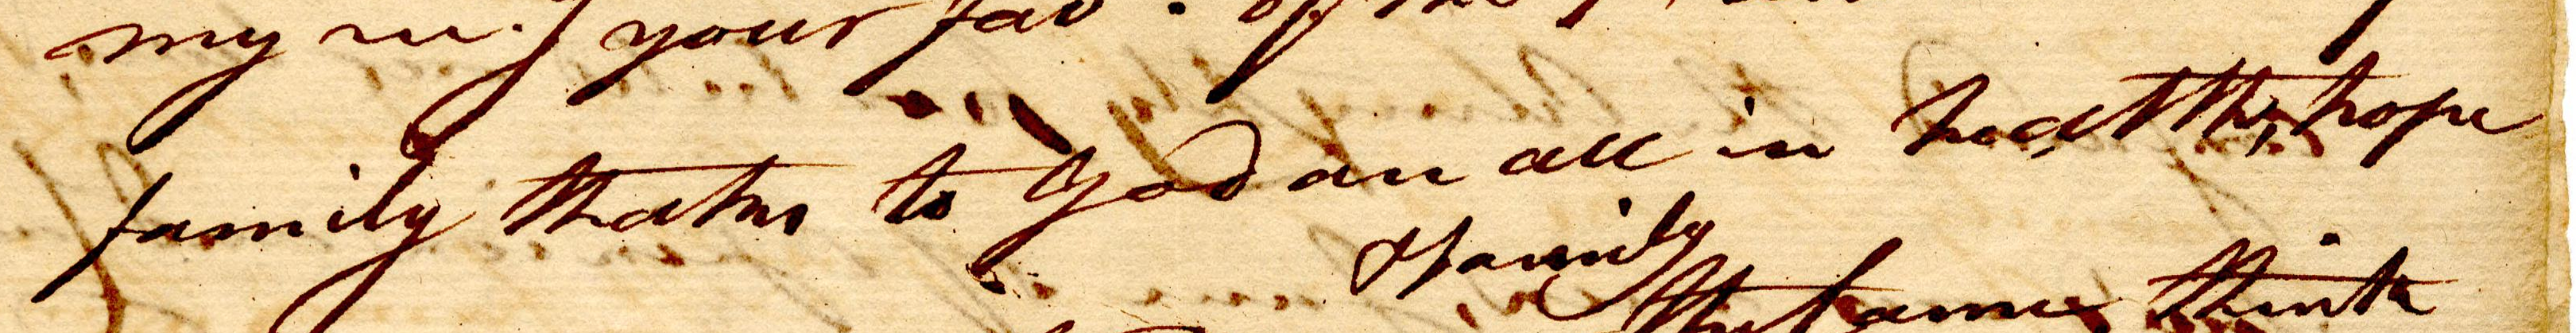family thanks to God are all in health the hope-
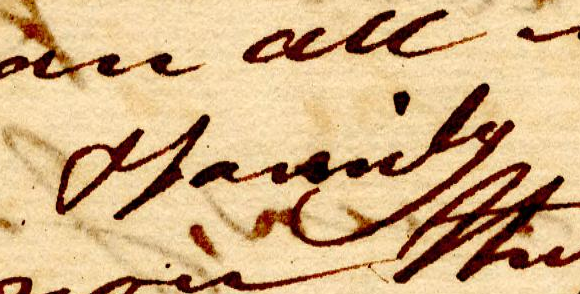& family
